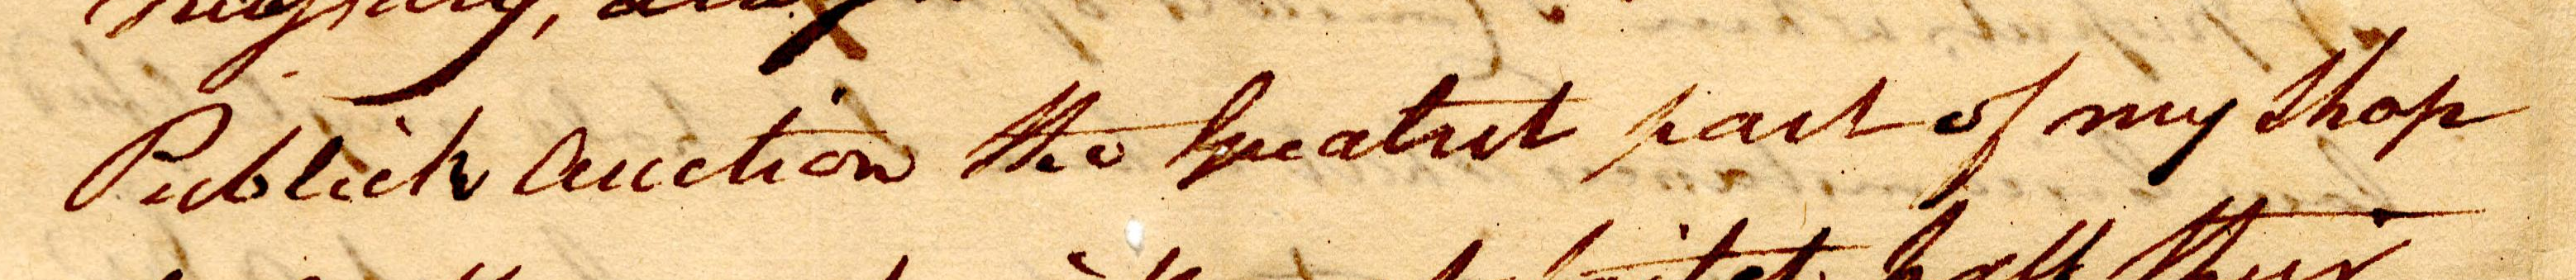Publick auction the Greater part of my shop
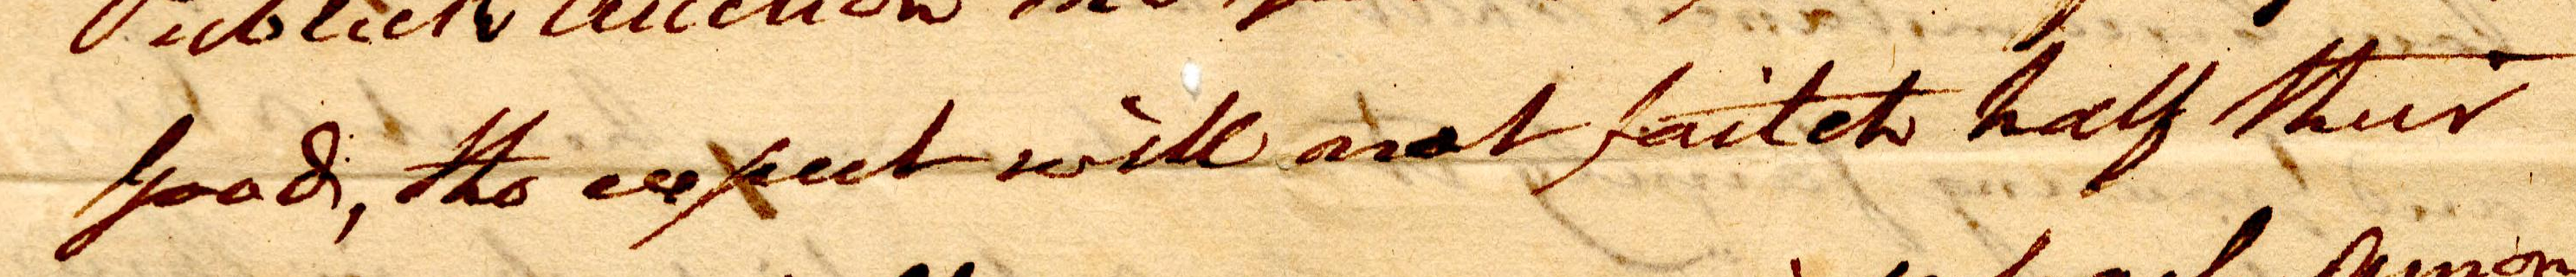goods, tho expect will not faitch half their
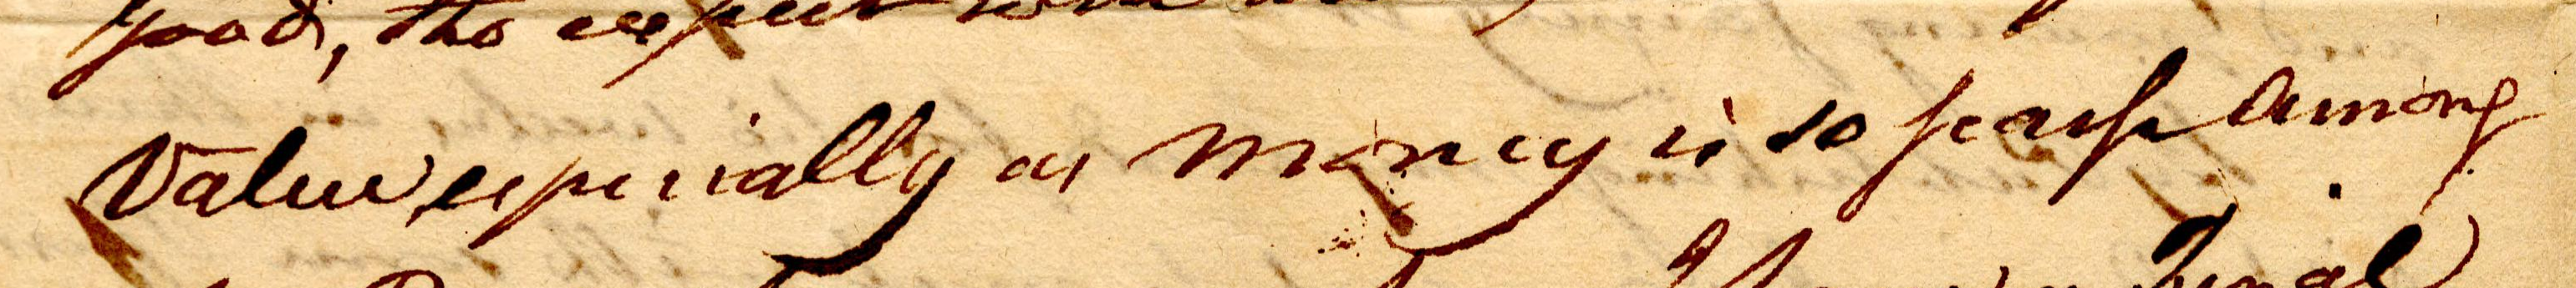Value especially as money is so scarse Among
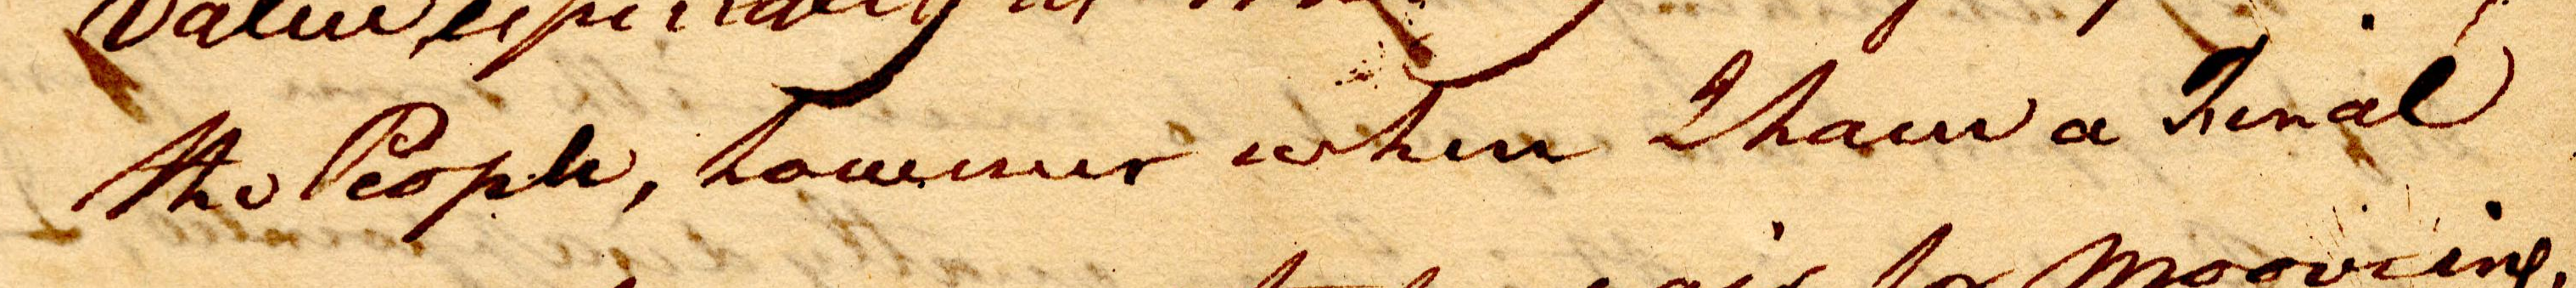the People, however when I have a Final
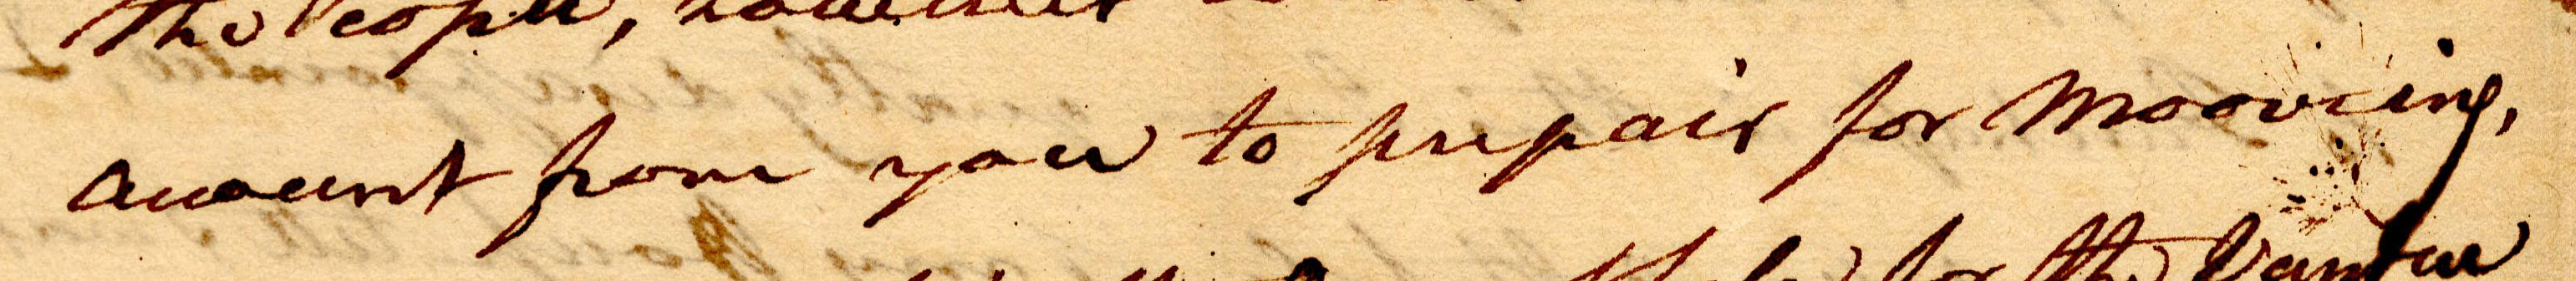account from you to prepair for mooving,
